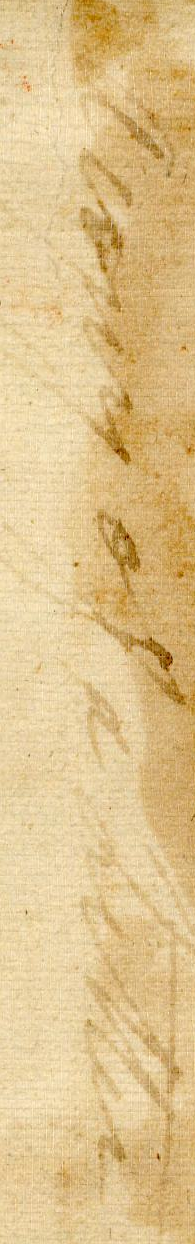A copy of a Letter
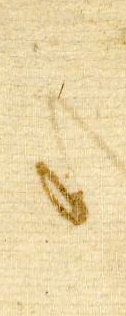To
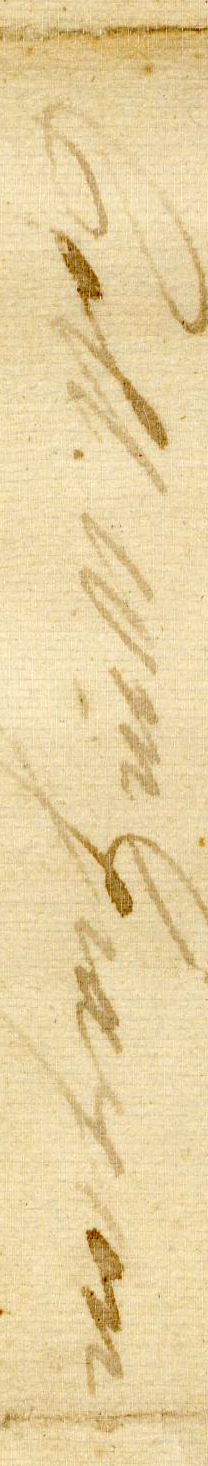Coll. W^m Grayson
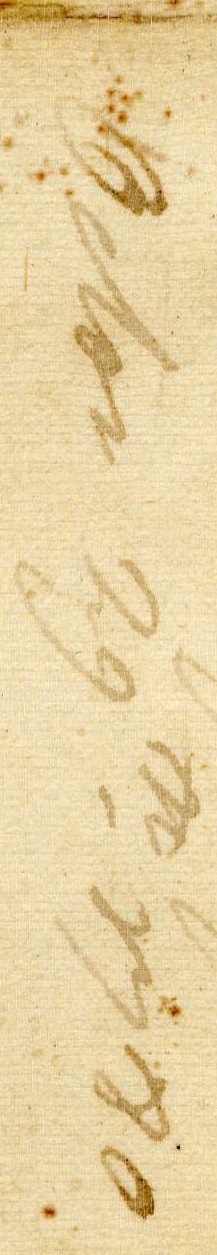Octor 29^th 1780
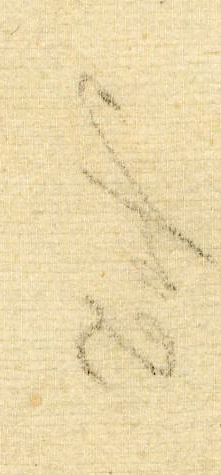N^o 2
